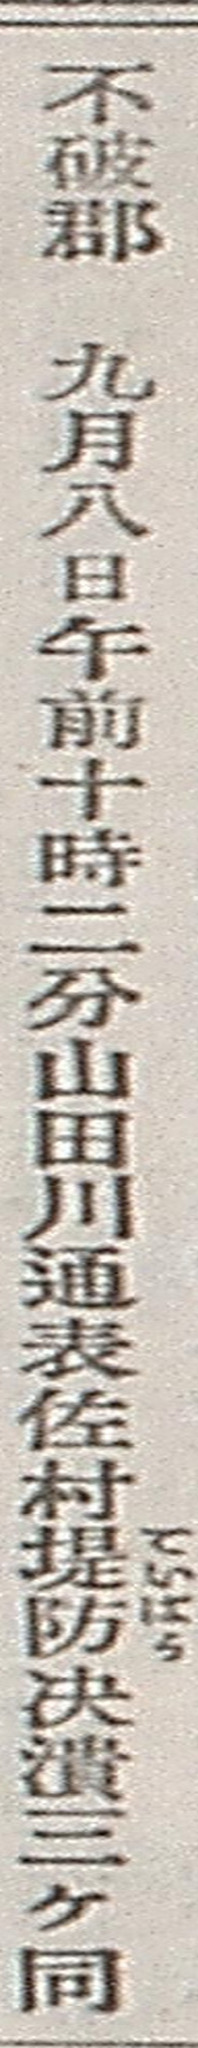不破郡九月八日午前十時二分山田川通表佐村堤防决潰三ヶ同
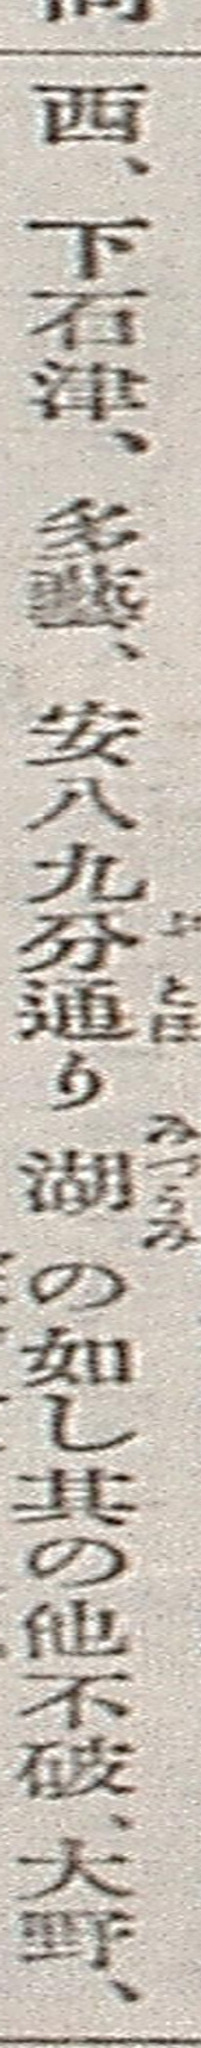西、下石津、多芸、安八九分通り湖の如し其の他不破、大野、
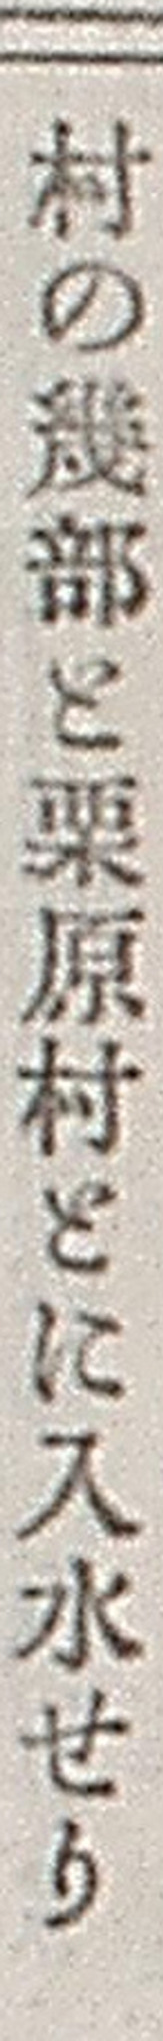村の幾部と栗原村とに入水せり
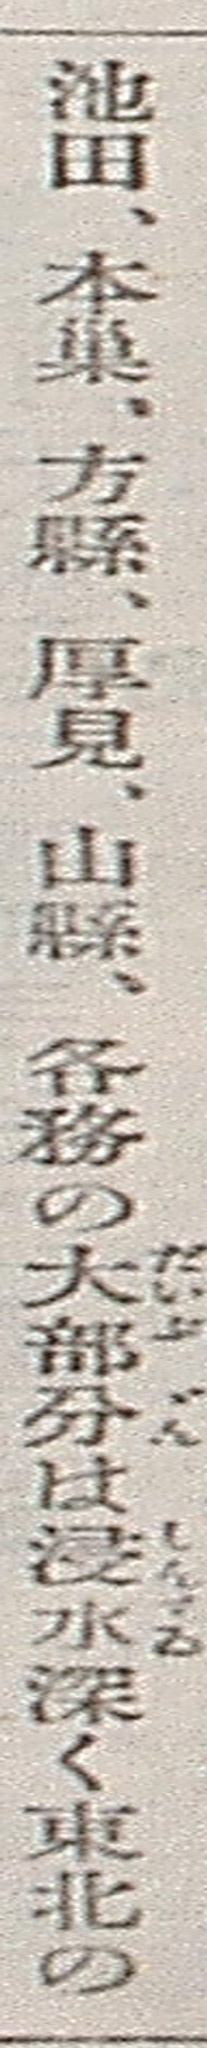池田、本巣、方縣、厚見、山縣、各務の大部分は浸水深く東北の

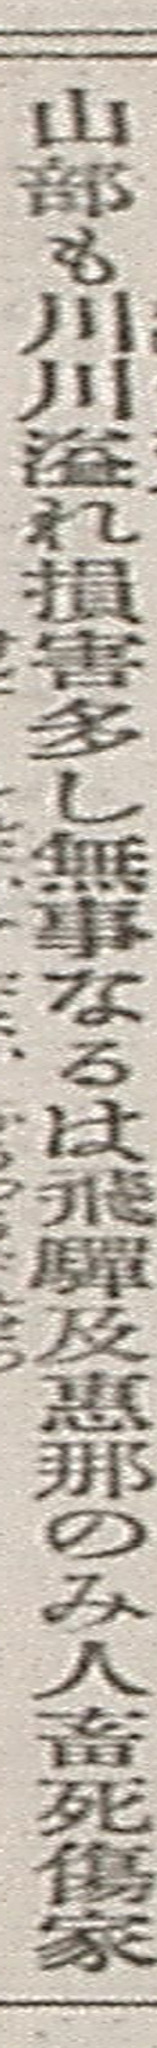山部も川川溢れ損害多し無事なるは飛騨及恵那のみ人畜死傷家
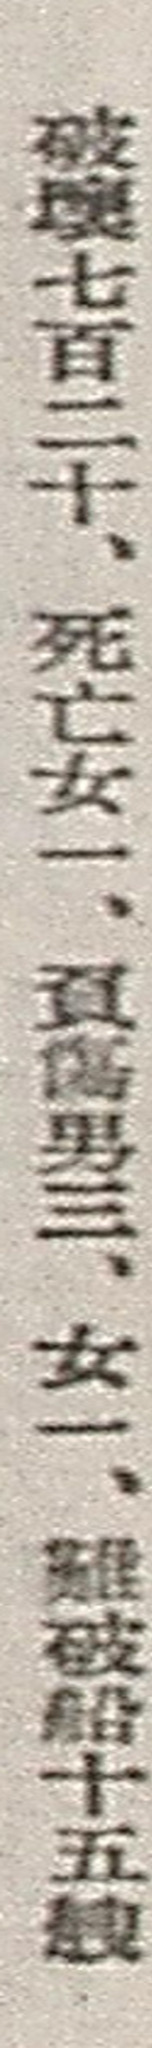破壊七百二十、死亡女一、負傷男三、女一、難破船十五艘
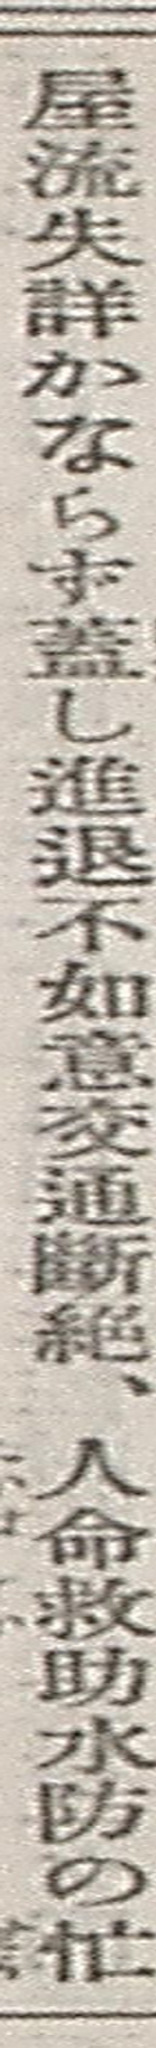屋流失詳かならず蓋し進退不如意交通断絶、人命救助水防の忙
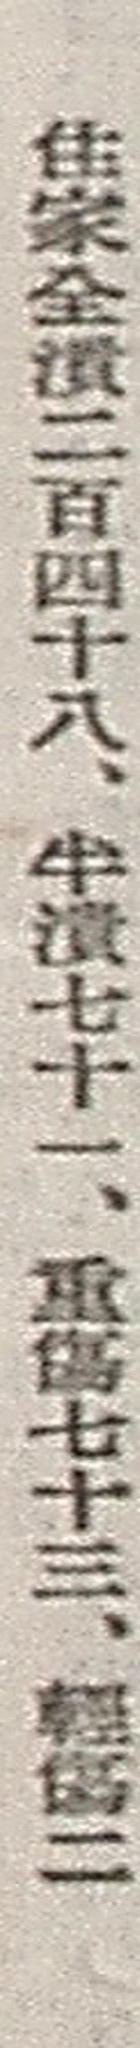住家全潰二百四十八、半潰七十一、重傷七十三、軽傷二
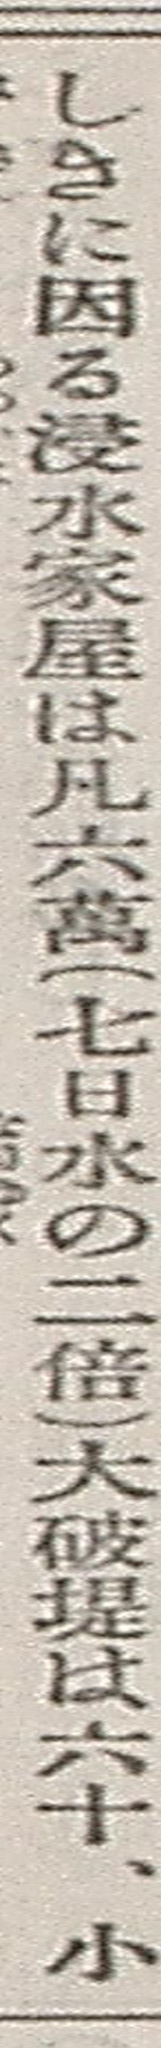しきに因る浸水家屋は凡六万大破堤は六十、小
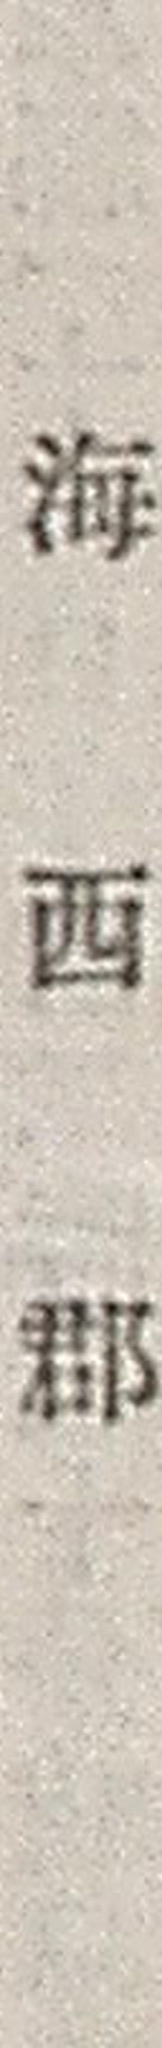海西郡
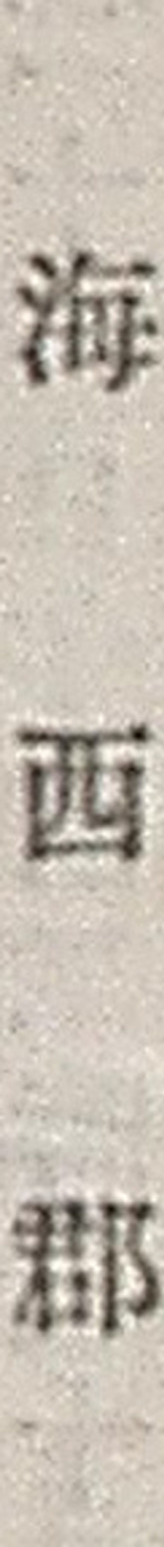海西郡
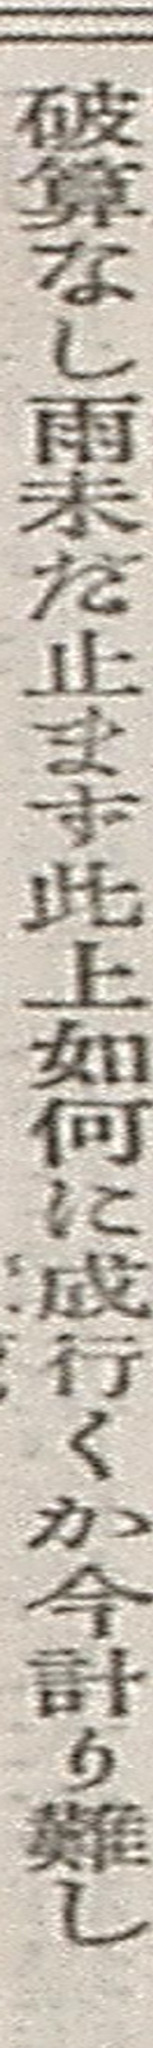破算なし雨未だ止まず此上如何に成行くか今計り難し
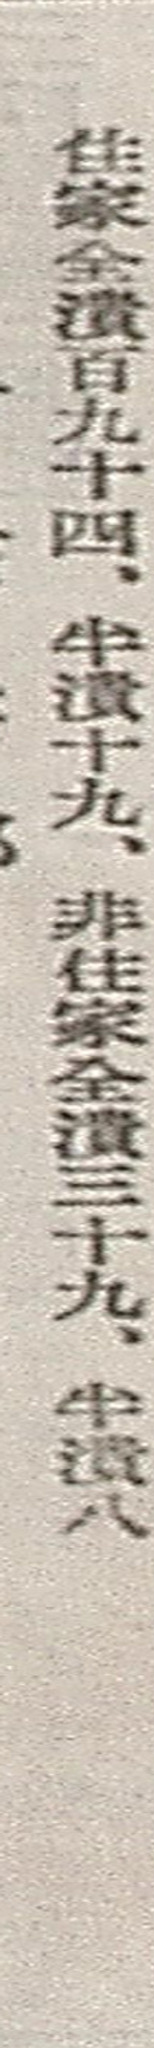住家全潰百九十四、半潰十九、非住家全潰三十九、半潰八
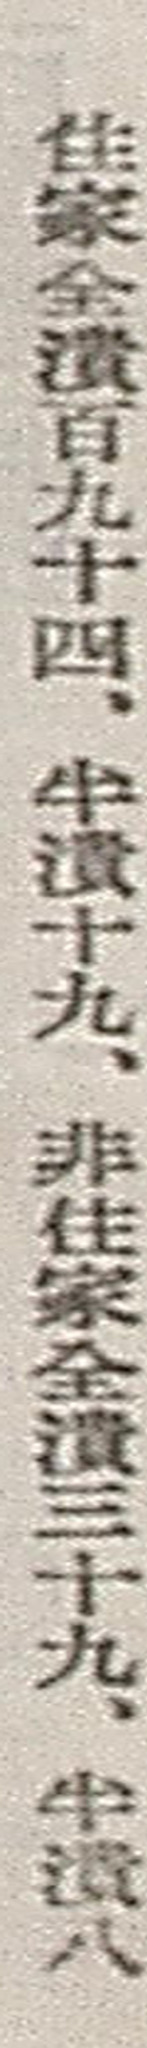住家全潰百九十四、半潰十九、非住家全潰三十九、半潰八
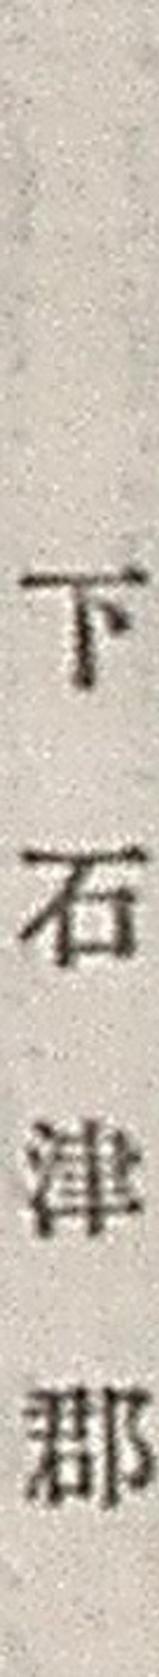下石津郡
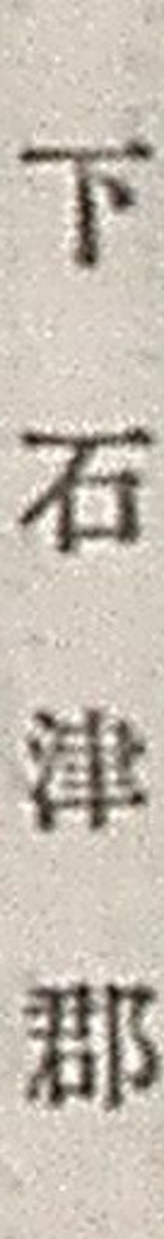下石津郡
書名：風俗畫報臨時増刊第百二十六號　洪水被害録（中）
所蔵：東京大学地震研究所図書室 Earthquake Research Institute Library, The University of Tokyo, JAPAN
